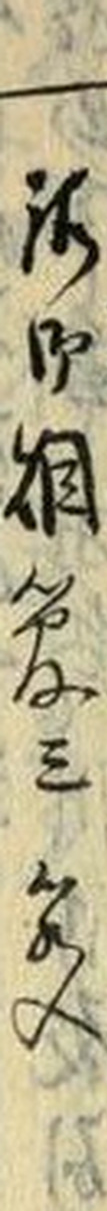銀御煙管三箱入
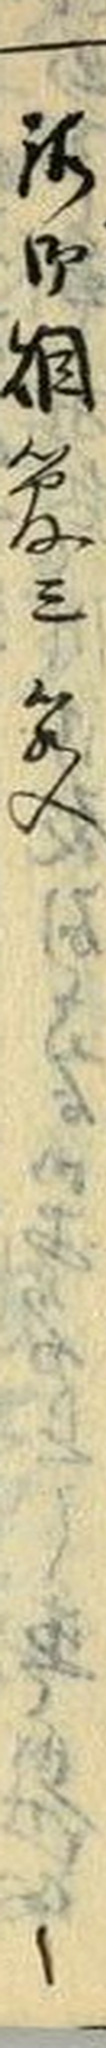銀御煙管三箱入
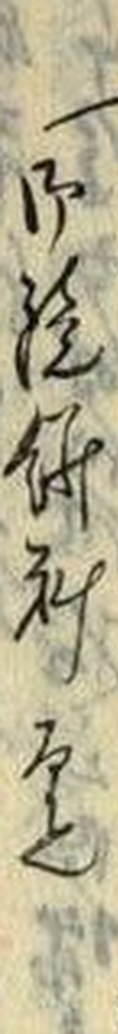御鏡餅料百疋
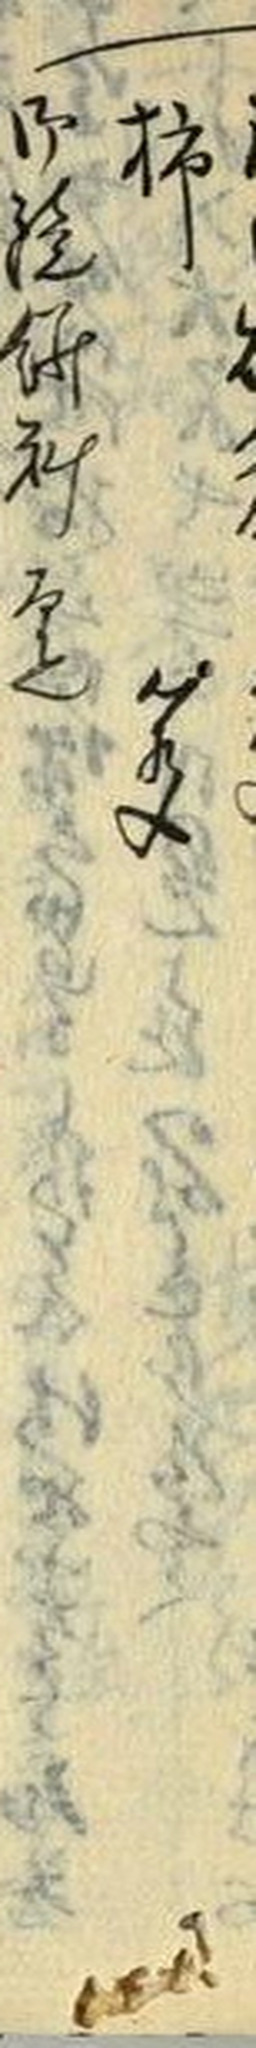御鏡餅料百疋
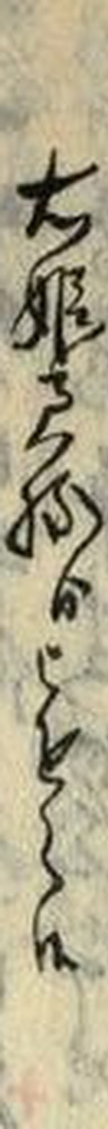右姫君様ゟ被進之候
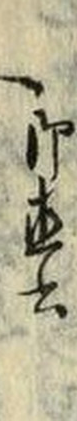御直書
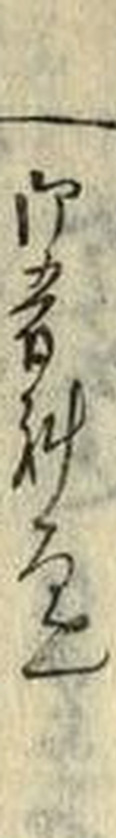御肴料百疋
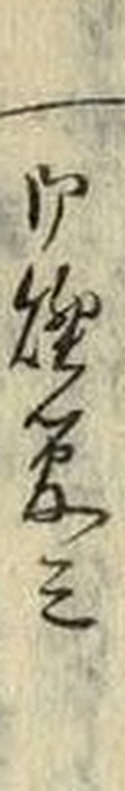御煙管三
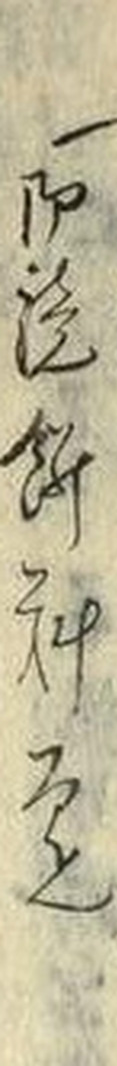御鏡餅料百疋
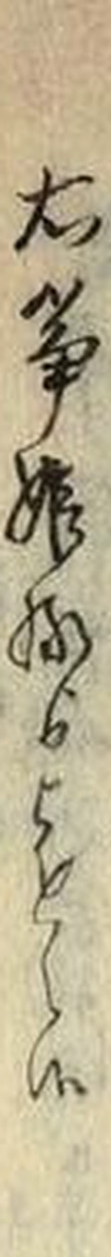右箏姫様ゟ被進之候
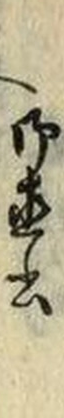御直書
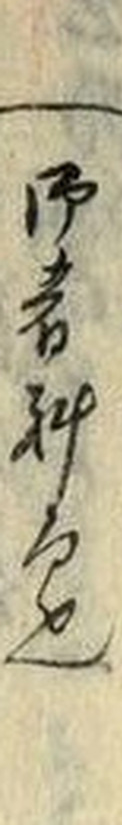御肴料百疋
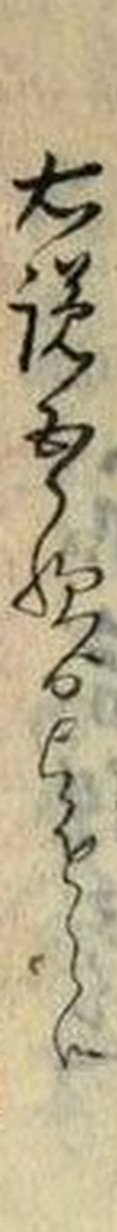右謙五郎様ゟ被進之候

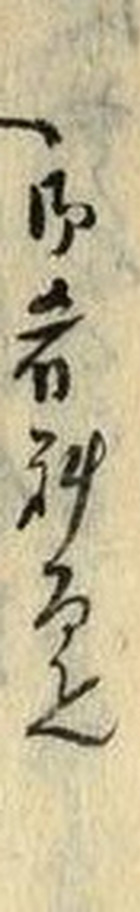御肴料百疋
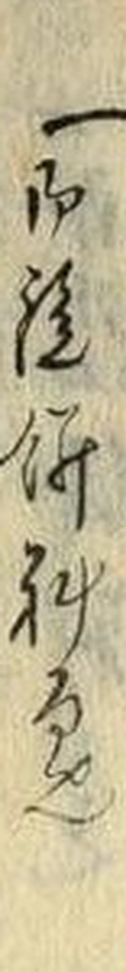御鏡餅料百疋
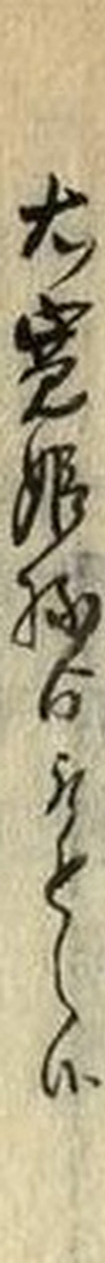右寛姫様ゟ被進之候
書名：少傅日録抄（斉承付側向頭取日記、在国）
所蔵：福井県文書館 Fukui Prefectural Archives
